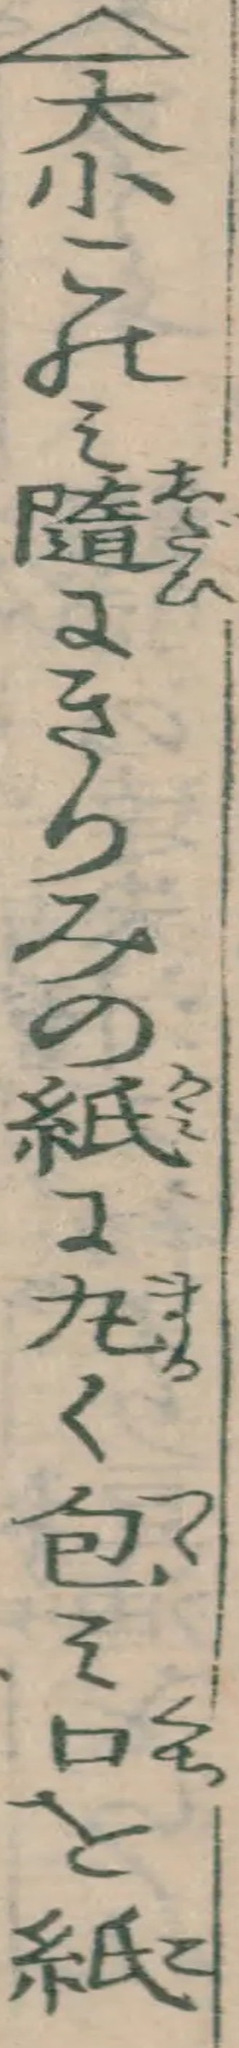△大小このみ随にきりみの紙に丸く包み口を紙
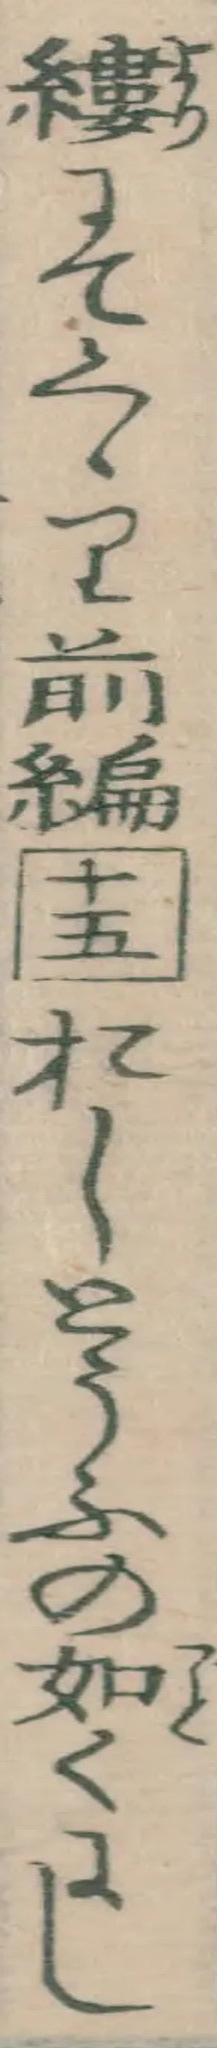縷にてくゝり前編十五おしとうふの如くにし
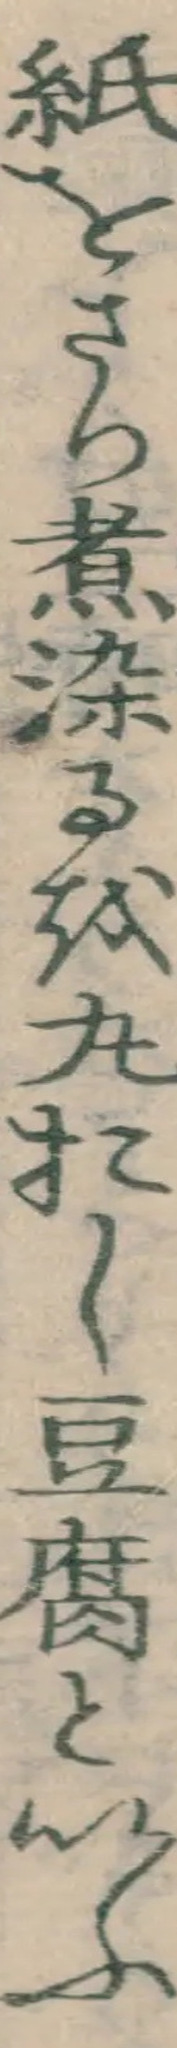紙をさり煮染るを丸おし豆腐といふ
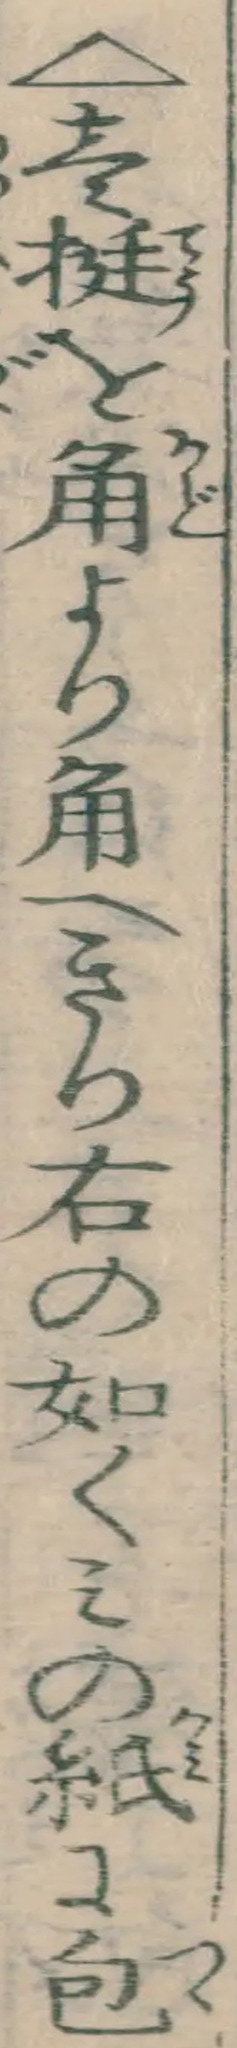△壱挺を角より角へきり右の如くみの紙に包
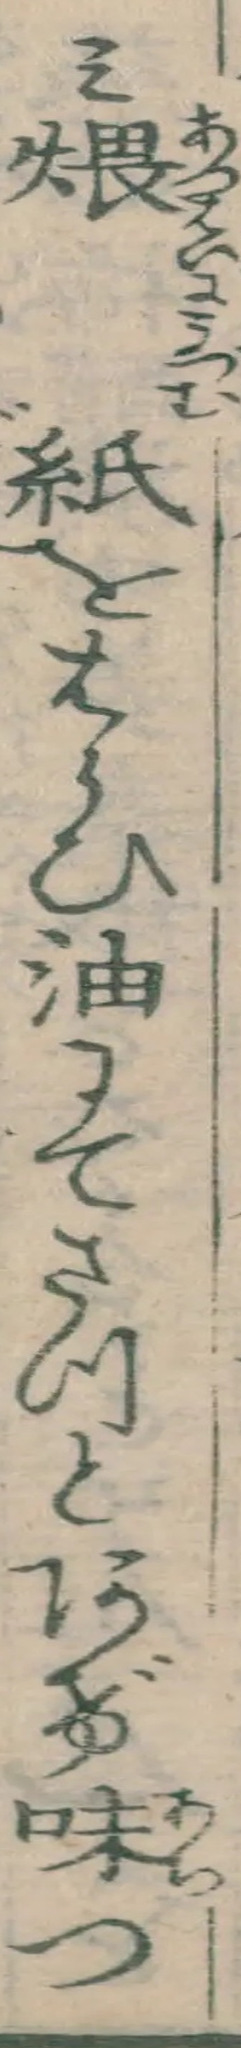み煨紙をはらひ油にてさつとあげ味つ
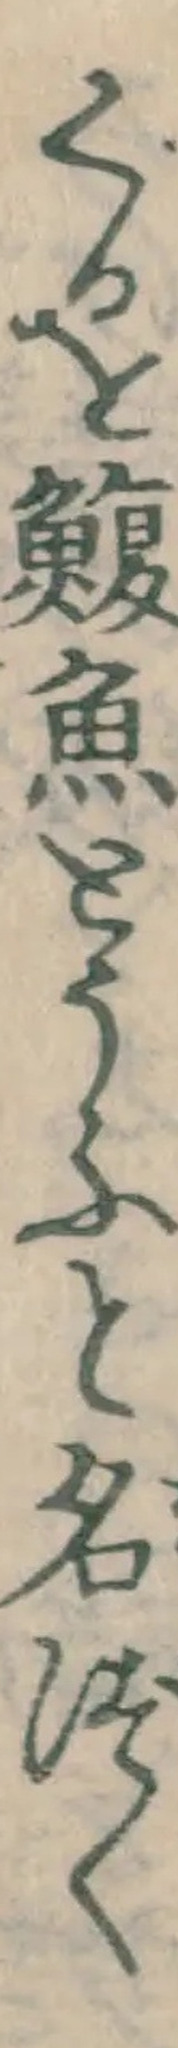くるを鰒魚とうふと名づく

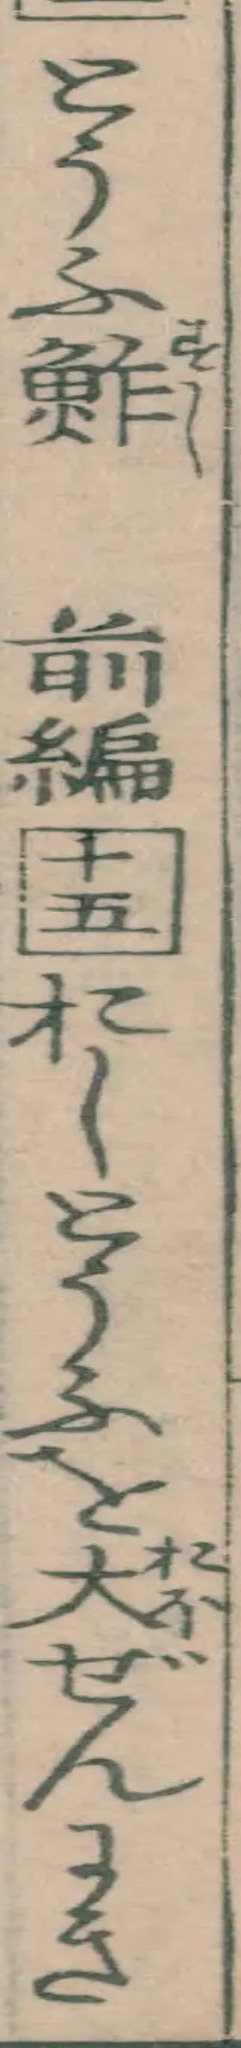四十五とうふ鮓前編十五おしとうふを大ぜんにき
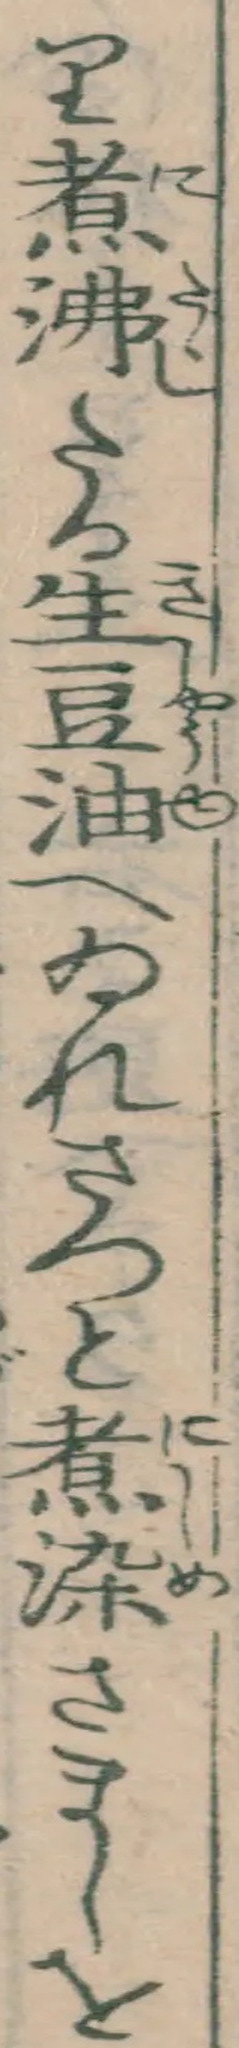り煮沸たる生豆油へゐれさつと煮染さましを
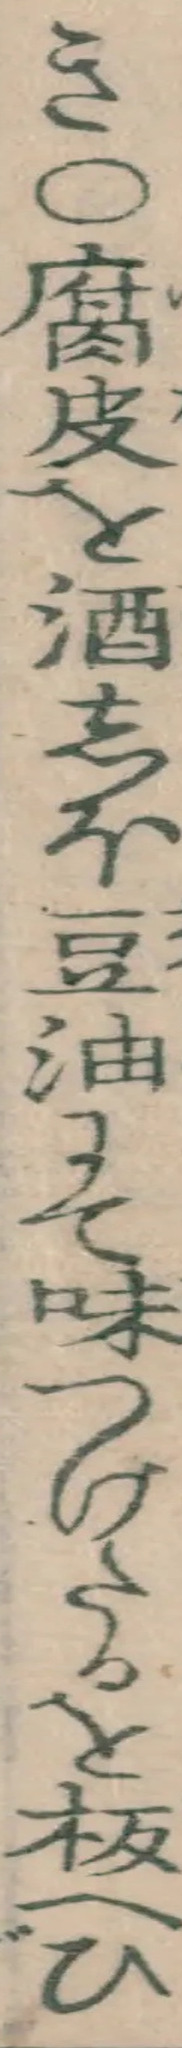き○腐皮を酒しほ豆油にて味つけたるを板へひ
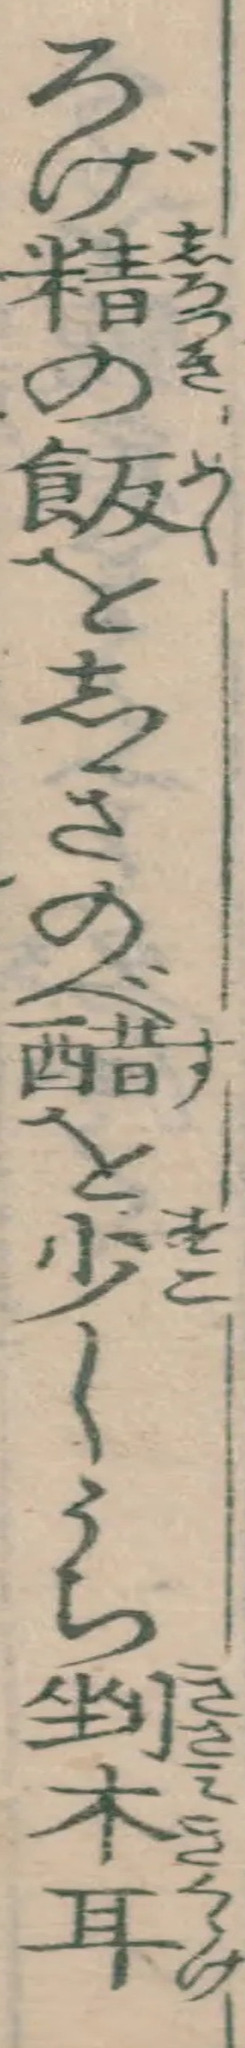ろげ精の飯をしきのべ醋を少しうち剉木耳
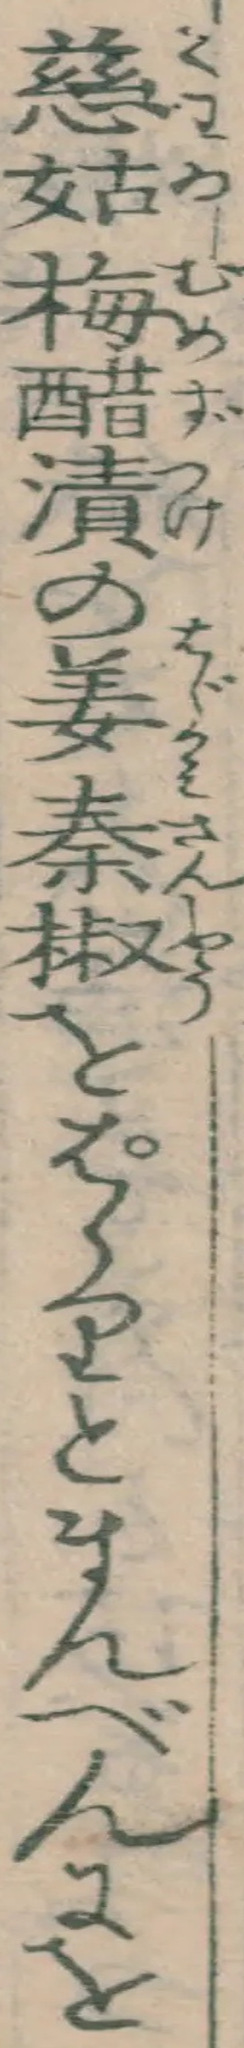慈姑梅醋漬の姜秦椒をぱらりとまんべんにを
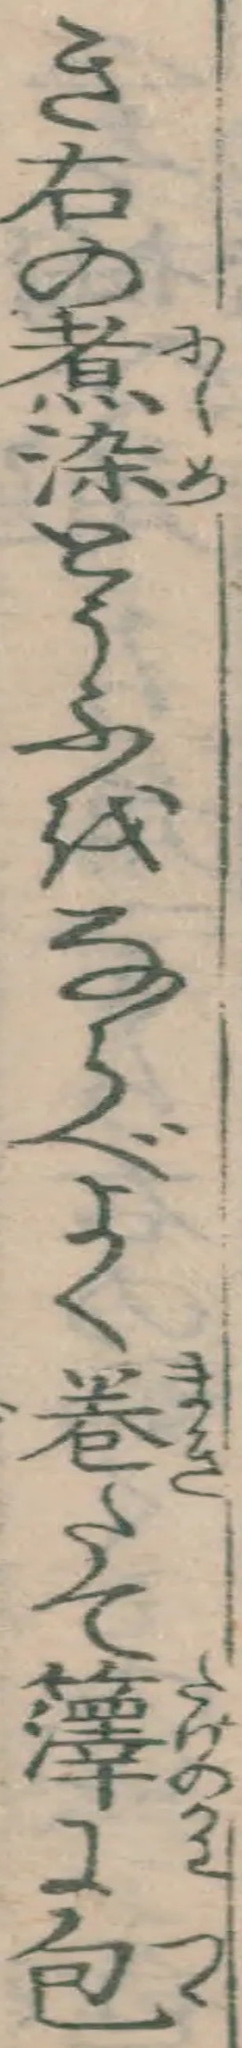き右の煮染とうふをならべよく巻たて䕪に包
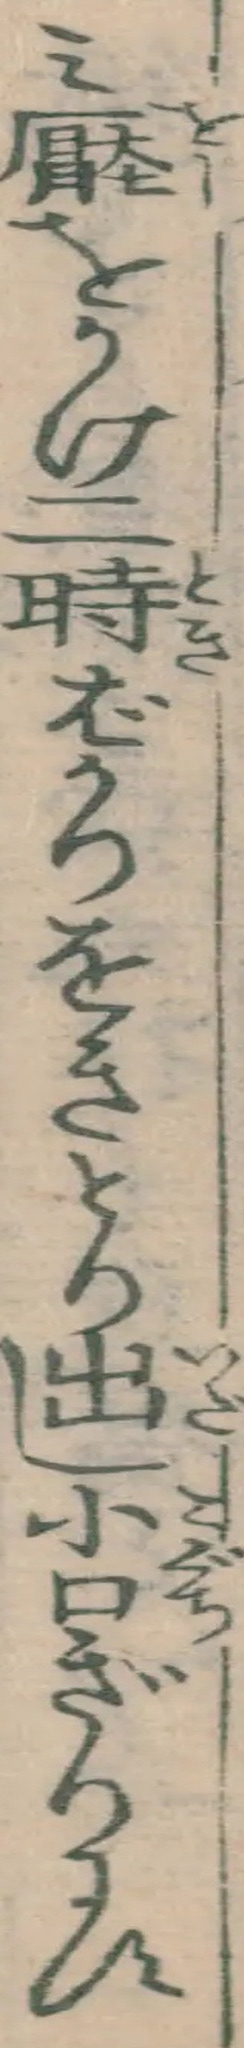み圧をかけ二時ばかりをきとり出し小口ぎりにす
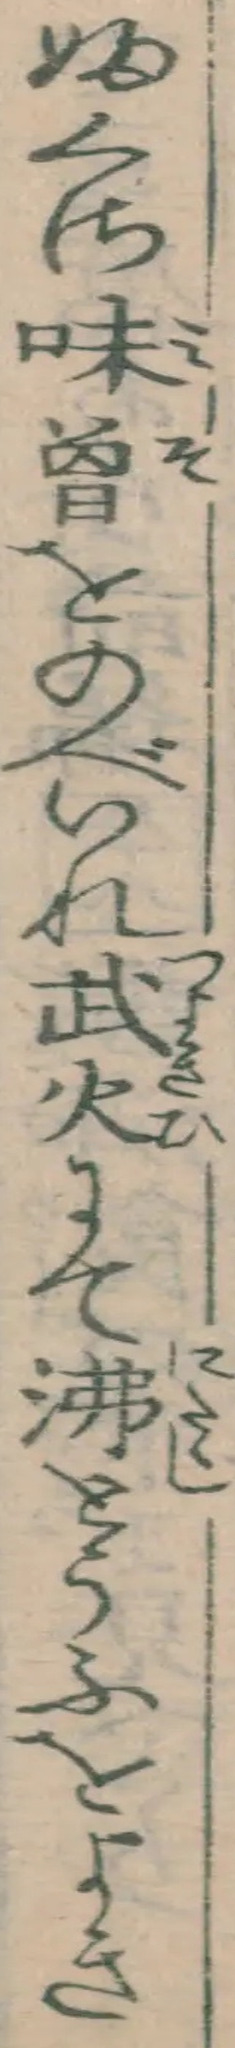ふくさ味曽をのべいれ武火にて沸とうふをよき
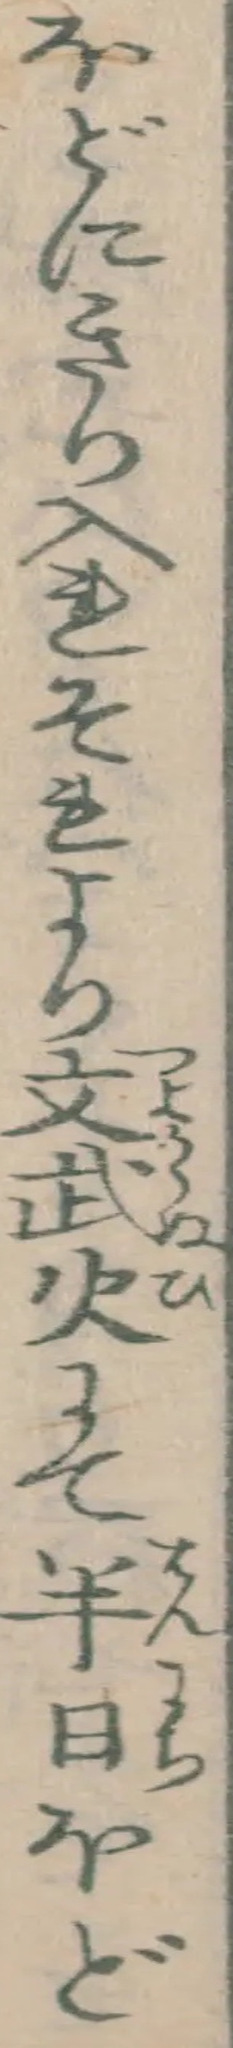ほどにきり入れそれより文武火にて半日ほど
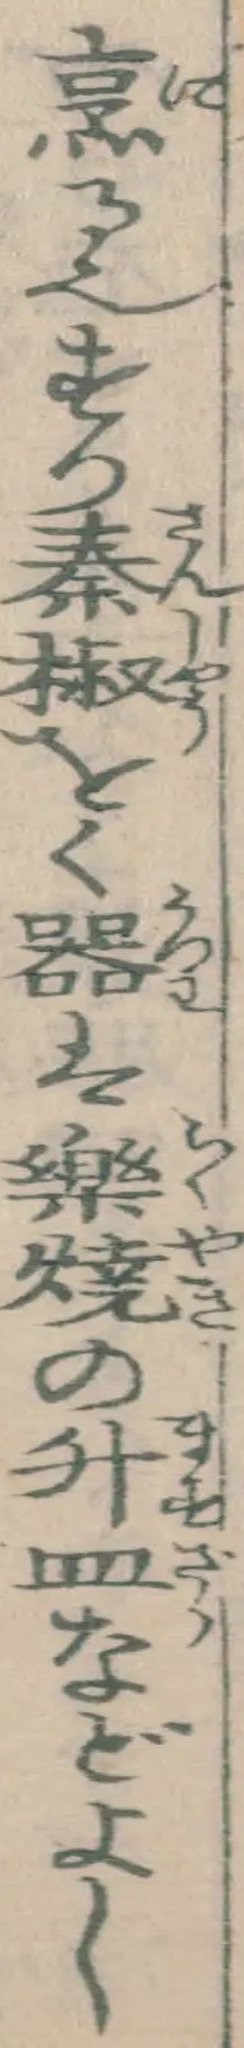烹る也すり秦椒をく器は楽焼の升皿などよし
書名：豆腐百珍. 続編
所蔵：国立国会図書館 National Diet Library, JAPAN
